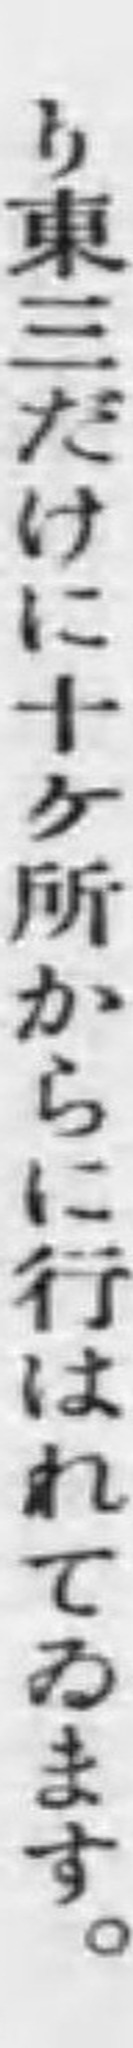り東三だけに十ヶ所からに行はれてゐます。
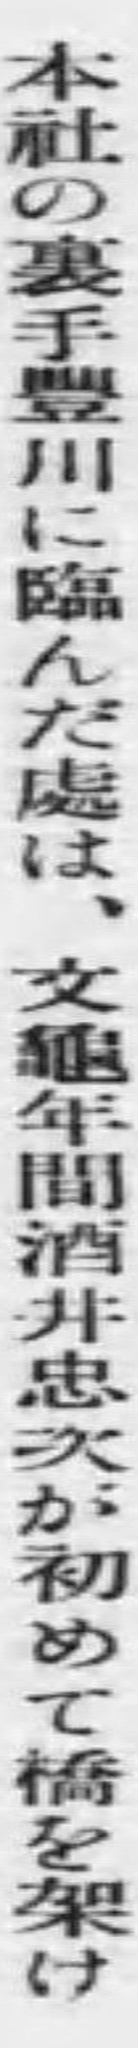本社の裏手豊川に臨んだ処は、文亀年間酒井忠次が初めて橋を架け
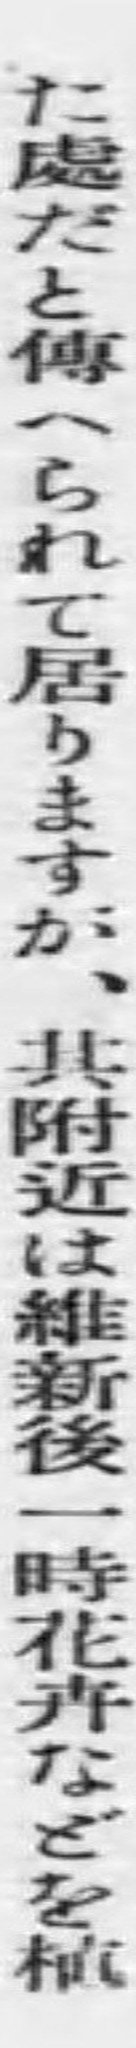た処だと伝へられて居りますが、其附近は維新後一時花卉などを植
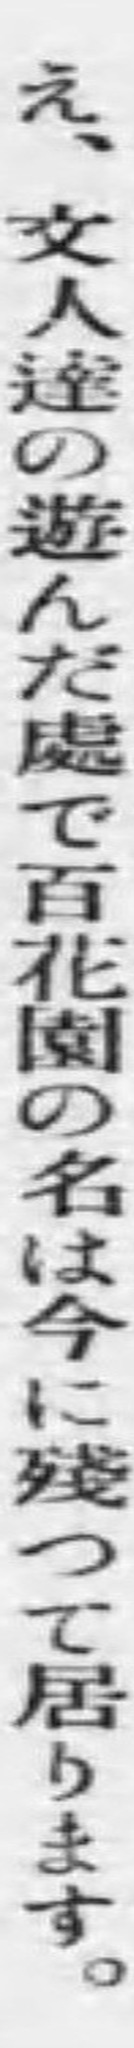え、文人達の遊んだ処で百花園の名は今に残つて居ります。
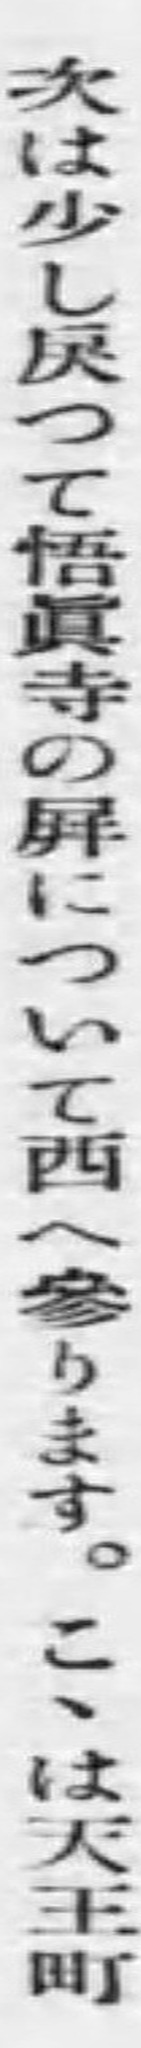次は少し戻つて悟真寺の屏について西へ参ります。こゝは天王町
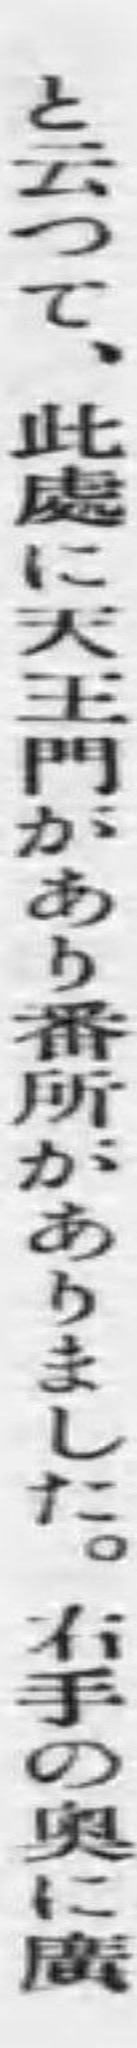と云つて、此処に天王門があり番所がありました。右手の奥に広
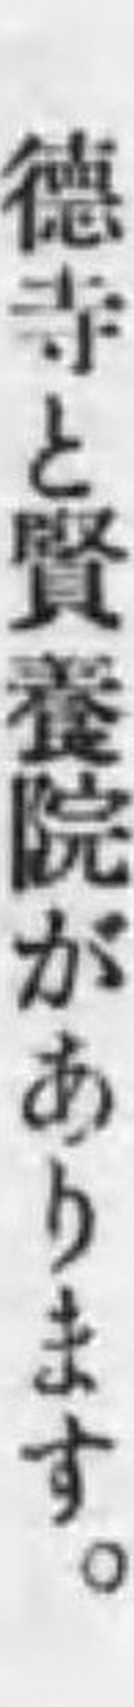徳寺と賢養院があります。
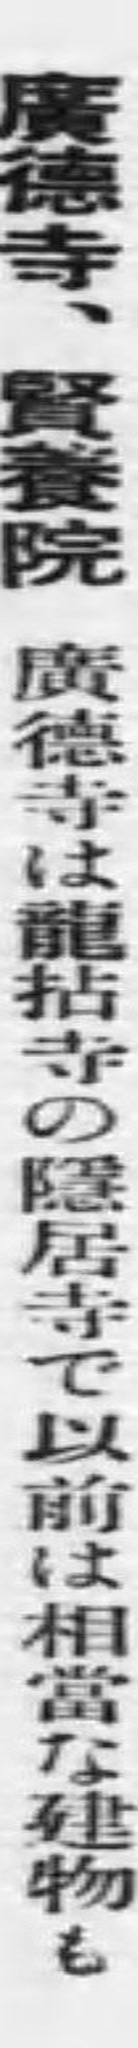広徳寺、賢養院広徳寺は龍拈寺の隠居寺で以前は相当な建物も
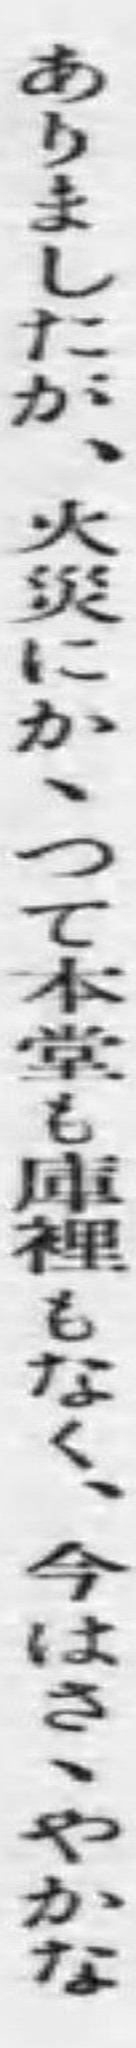ありましたが、火災にかゝつて本堂も庫裡もなく、今はさゝやかな
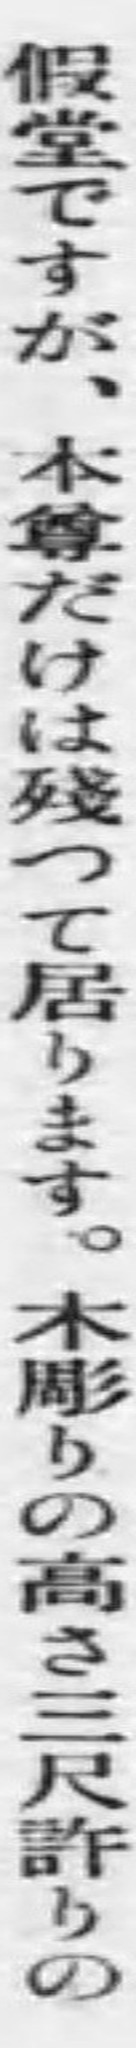仮堂ですが、本尊だけは残つて居ります。木彫りの高さ三尺許りの
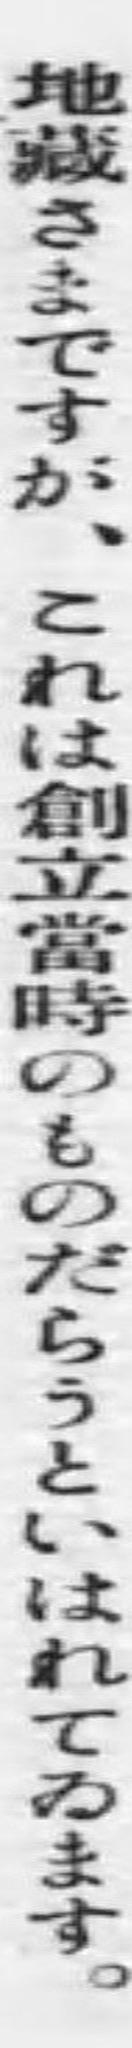地蔵さまですが、これは創立当時のものだらうといはれてゐます。

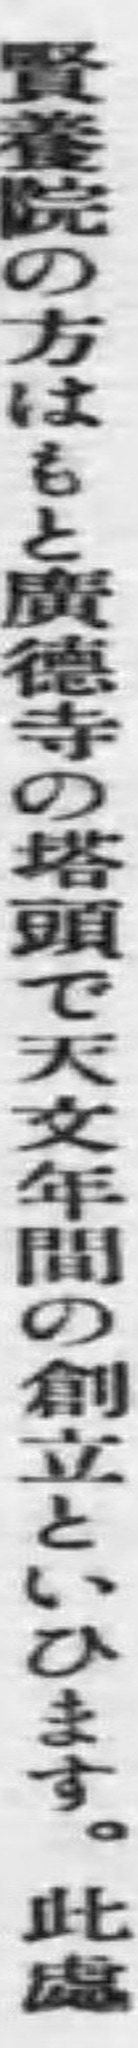賢養院の方はもと広徳寺の塔頭で天文年間の創立といひます。此処
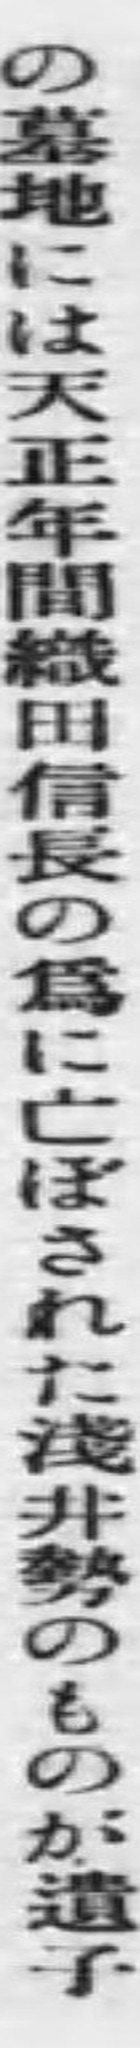の墓地には天正年間織田信長の為に亡ぼされた浅井勢のものが遺子
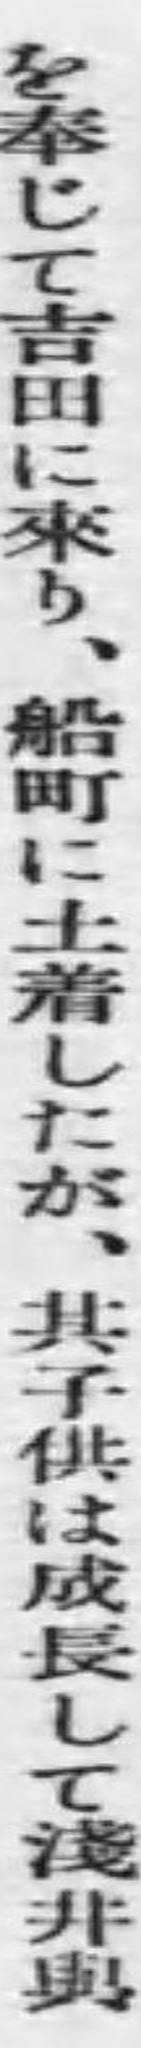を奉じて吉田に来り、船町に土着したが、其子供は成長して浅井与
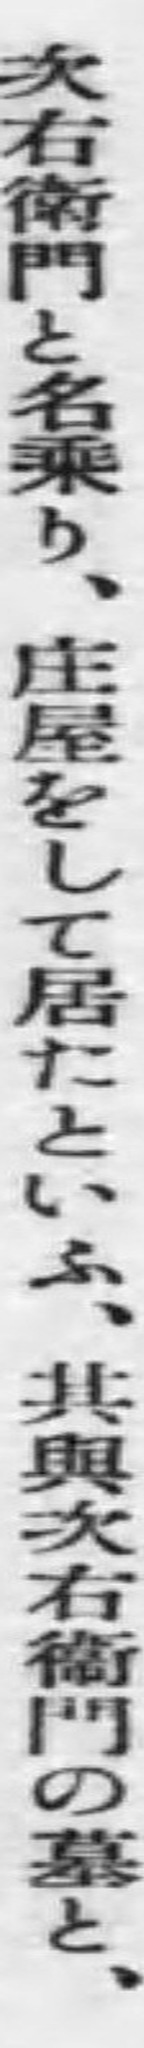次右衛門と名乗り、庄屋をして居たといふ、其与次右衛門の墓と、
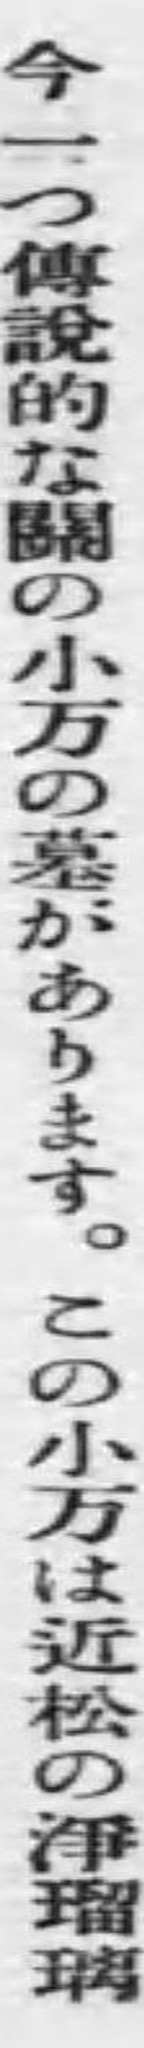今一つ伝説的な関の小万の墓があります。この小万は近松の浄瑠璃
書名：東三河道中記 : 豊橋市及其附近案内
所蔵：国立国会図書館 National Diet Library, JAPAN
